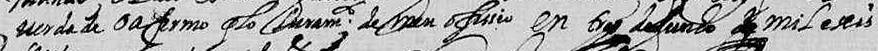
uerdade o afirmo p̄lo Iuramto. de meu ofissio en tres de Junho de mil e seis
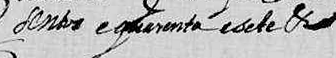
centos e quarenta e sete &
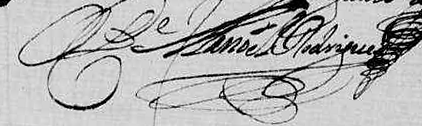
O Pe Manoel Rodrigues
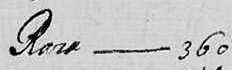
Raza - 360
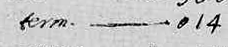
term. - 014
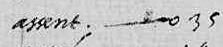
assent. - 035
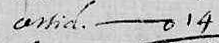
certid. - 014
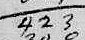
423
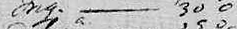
Inq. - 300
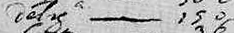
deliga - 150
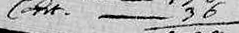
Cont. - 36
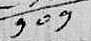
909
